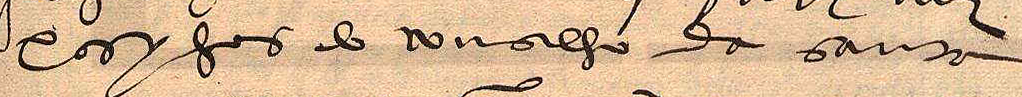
e asy hos do conselho da santa
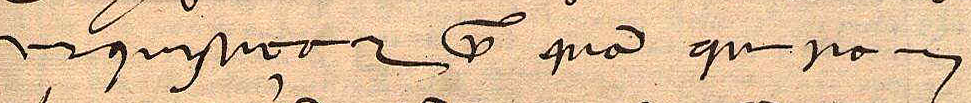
enquisiçam p̄o quā queriam
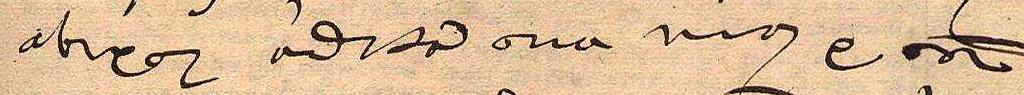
avexar a ditā sua maj e o s̄r
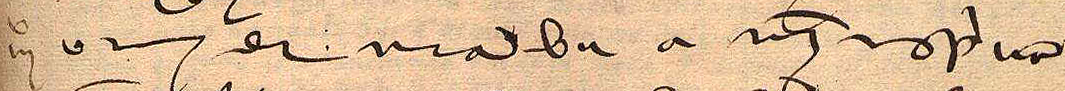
iijo oujdor mādou a mj̄ espiuā
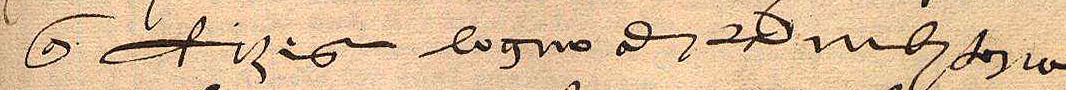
q̄ fizese loguo a djta enebjtoria
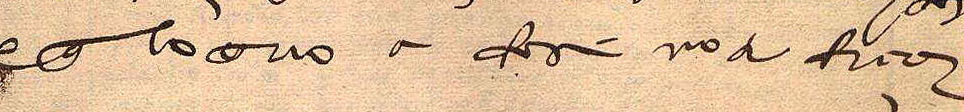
e q̄ loguo a fose noteficar
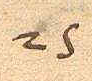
25
